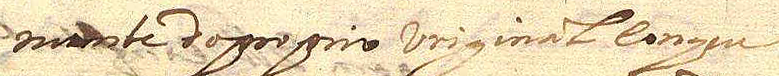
mente do proprio vriginaL con que
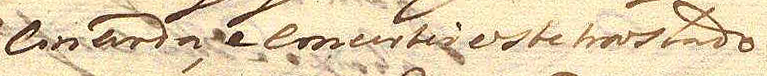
concorda, e concertei este traslado
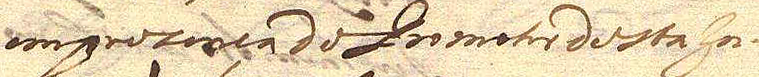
em prezença do Promotor desta Jn
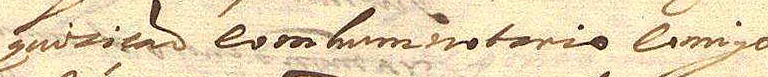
quiziçaõ com hum notario comigo
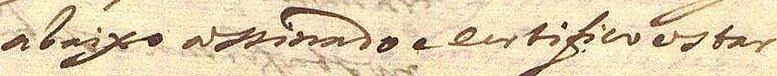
abaixo assinado e certifico estar
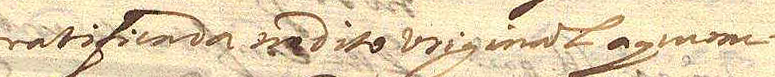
ratificada no dito vriginal a quem
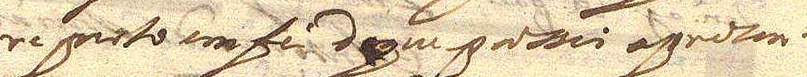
reporto em fé do que passei a prezen
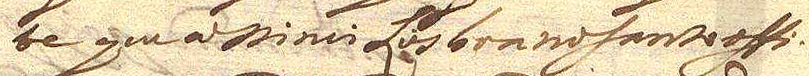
te que assinei Lisboa no santo offi
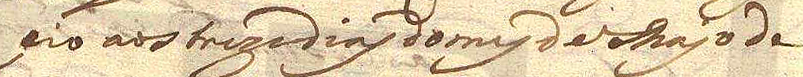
çio aos treze dias do mes de Majo de
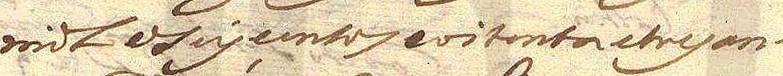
miL e seisçentos e oitenta e tres an
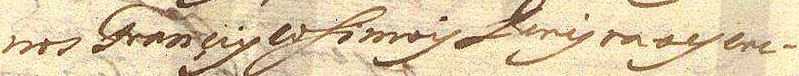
nos Françisco simois Pereira o escre
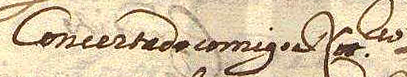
Concertado comigo Not.ro
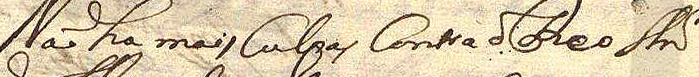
Naõ ha mais Culpas Contra o Reo Anto
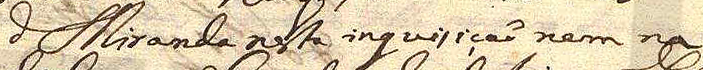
de Miranda nesta inquisiçaõ nem na
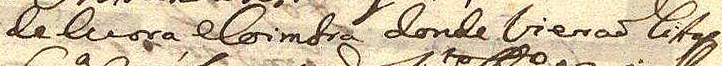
de Euora, e Coimbra donde Vieraõ Citas
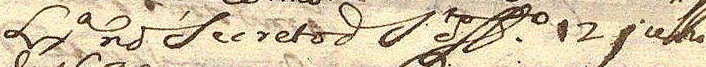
Lxa no Secreto d̄ Sto off.o 12 julho
